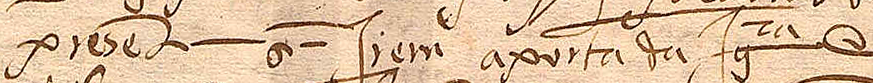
presēte sē Jrem a porta da Jgra e
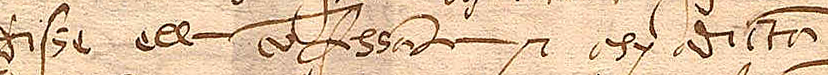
disse elle cōfessāte e asy a dic̄ta
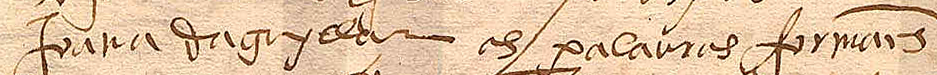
Joana daguyllar as palauras form̄aes
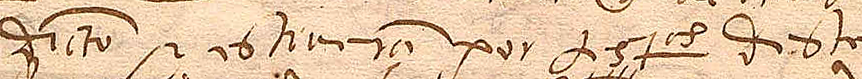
dīcto e estiuerā por testas deste
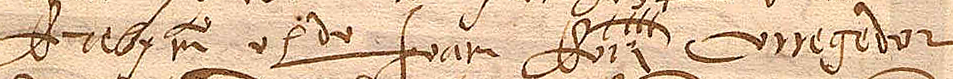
Recebymto o Ldo Joam Roiz Corregedor
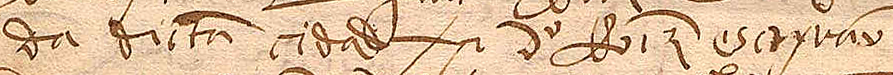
da dic̄ta cidade / e do Rōiz escryuão
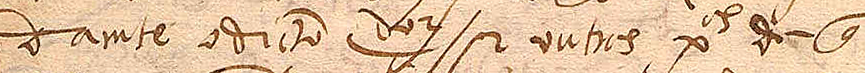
damte o dic̄to dor / e outras pas de q̄
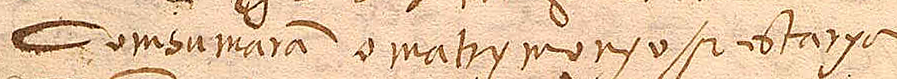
Comsumarā o matrymonyo / e estarya
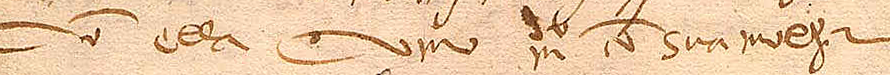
Cō ella Como mdo cō sua molher
